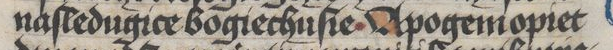naſledugíce bogíechu ſie. A pogem opiet¬
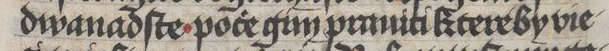dwanadſte.poċe gím prauiti kteréby vie
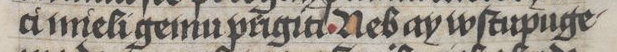ci mieli gemu pṙigíti.Neb ay wſtupuge¬
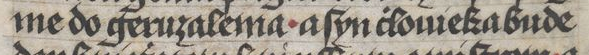me do geruzalema.a ſyn ċlouíeka bude
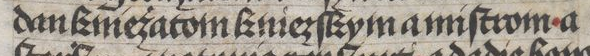dan kníežatonu kniezſkym a miſtrom.a
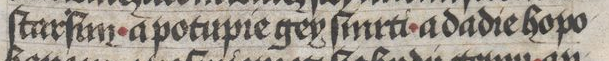ſtarẛim.a potupíe gey ſmrti.a dadíe ho po¬
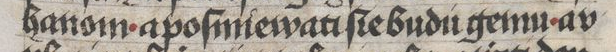hanom.a poſmiewati ſie budú gemu.a v¬
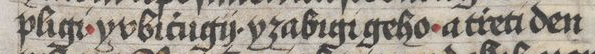pligí.yvbičugij.y zabigí geho.a tṙetí den
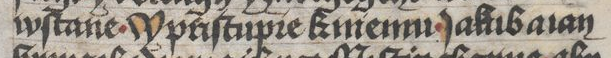wſtane.Y priſtupie k níemu.Iakub a ian
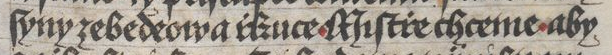ſyny zebedeowa ṙkuce.Miſtṙe chceme.aby
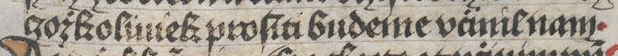czożkoliuiek proſiti budeme vċinil nam.
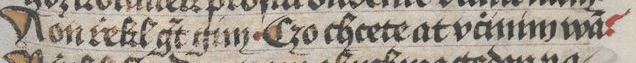A on ṙekl ḡt gim.Czo chcete at vċíním wā?
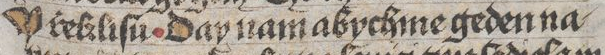Y ṙekli ſu.Day nam abychme geden na¬
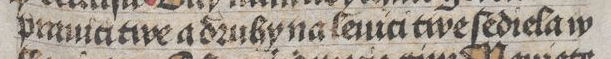prauiti twe a druhy na leuici twe ſediela w¬
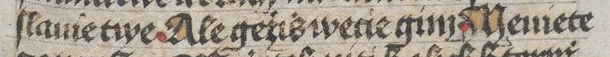ſlauie twe.Ale geżiṡ wecie gim.Neuíete
